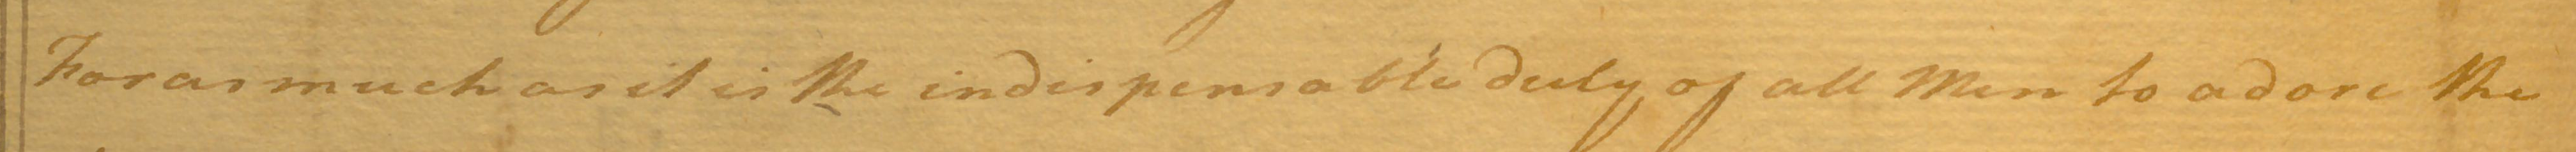For as much as it is the indispensable duty of all Men to adore the
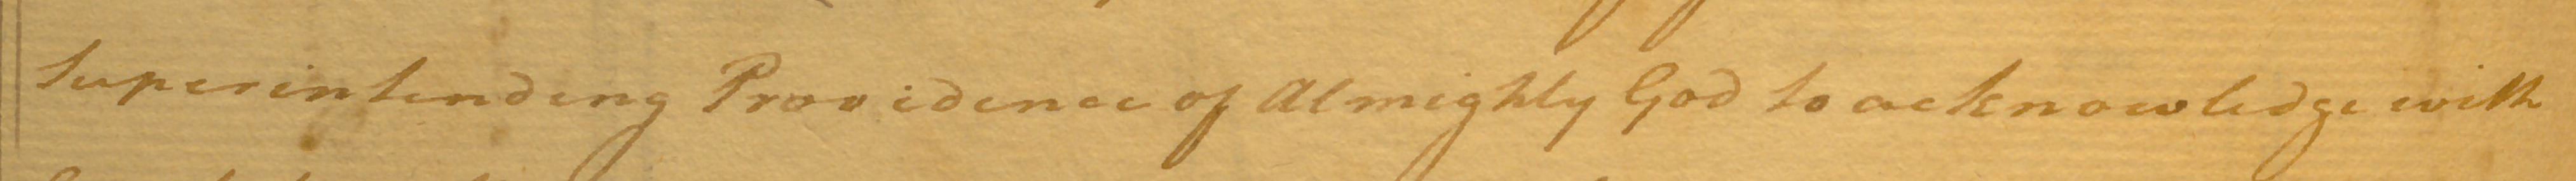superintending Providence of Almighty God to acknowledge with
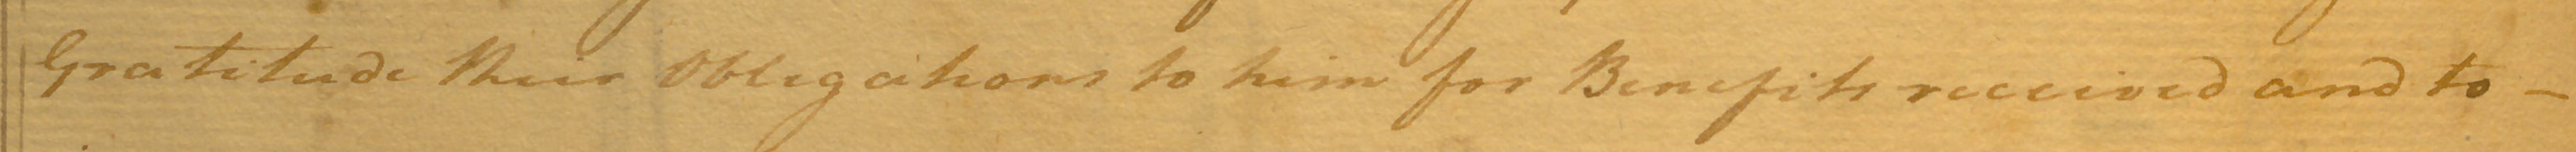Gratitude their obligations to him for Benefits received and to-
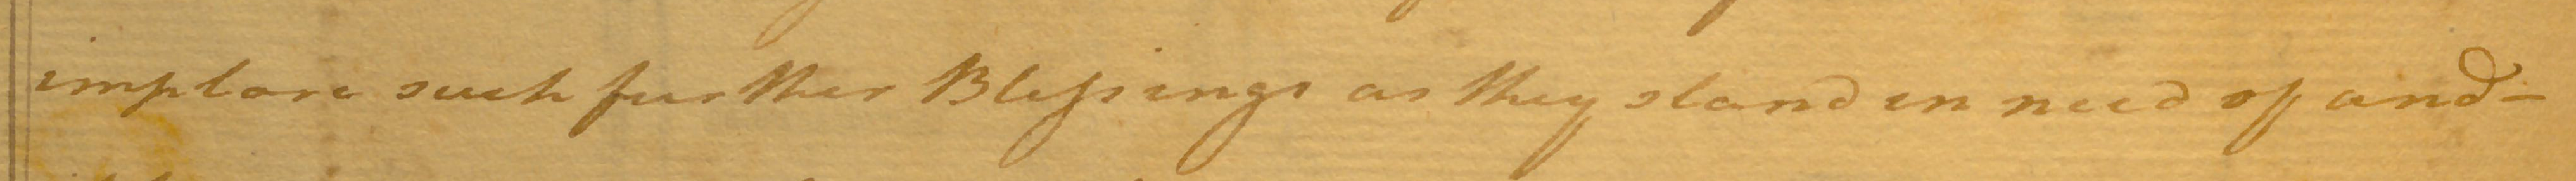implore such further Blessings as they stand in need of and-
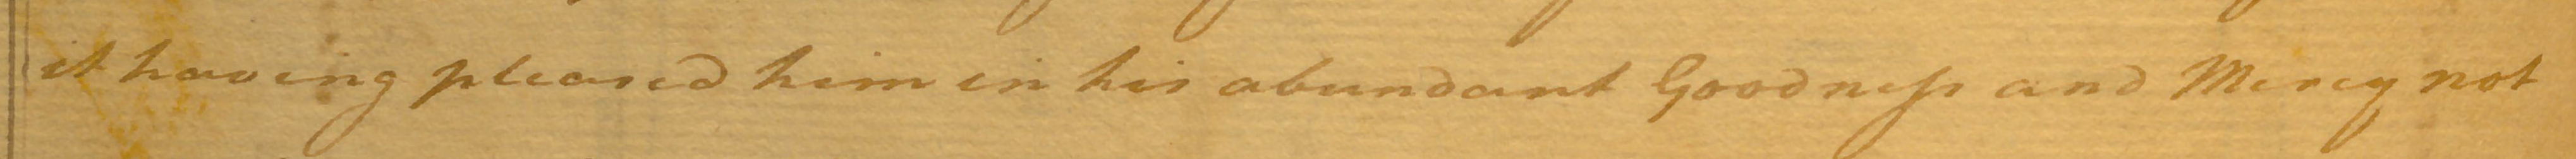it having pleased him in his abundant Goodness and Mercy not
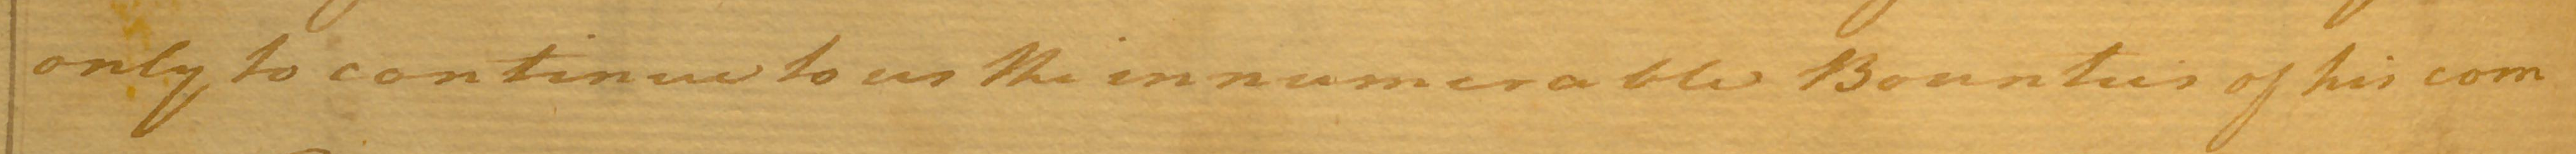only to continue to us the innumerable Bounties of his com
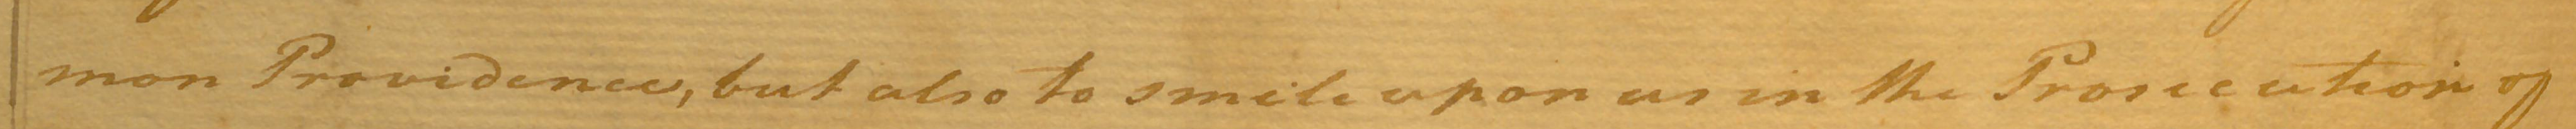mon Providence, but also to smile upon us in the Prosecution of
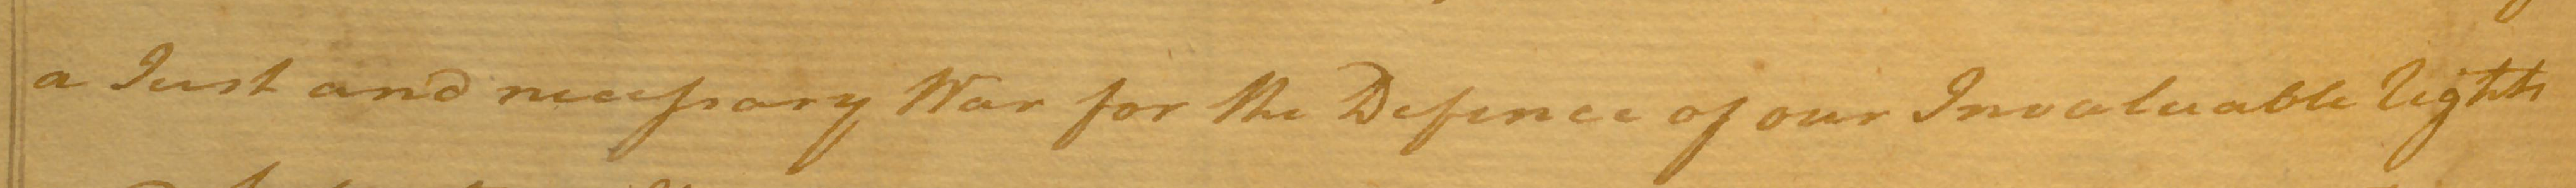a Just and necessary War for the Defence of our Invaluable rights
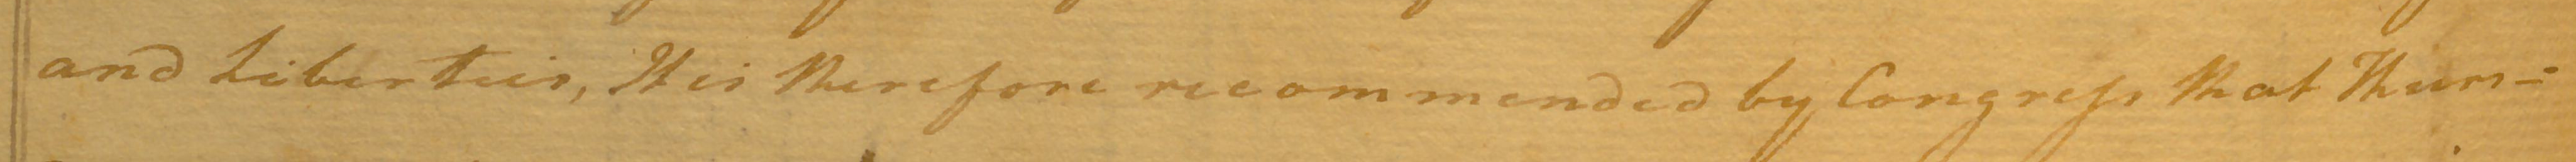and Liberties, It is therefore recommended by Congress that Thurs-
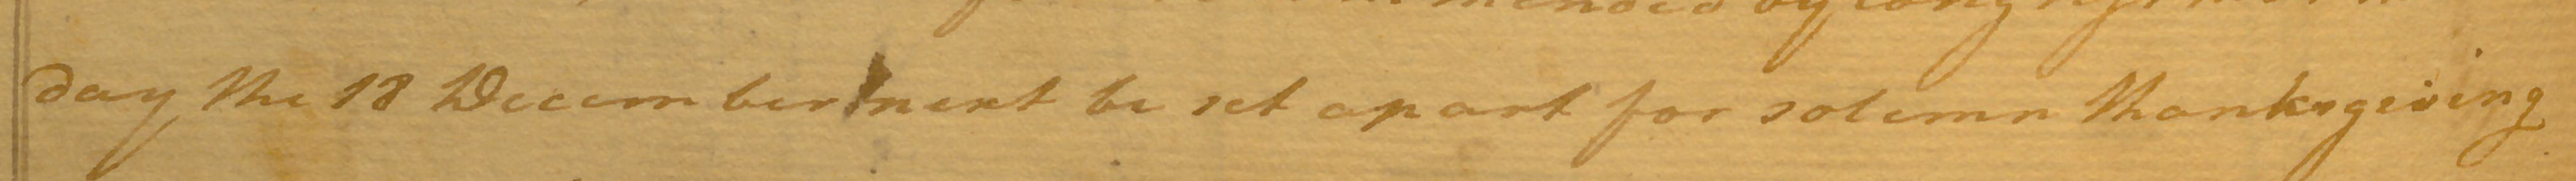day the 18 December next be set apart for solemn thanksgiving
